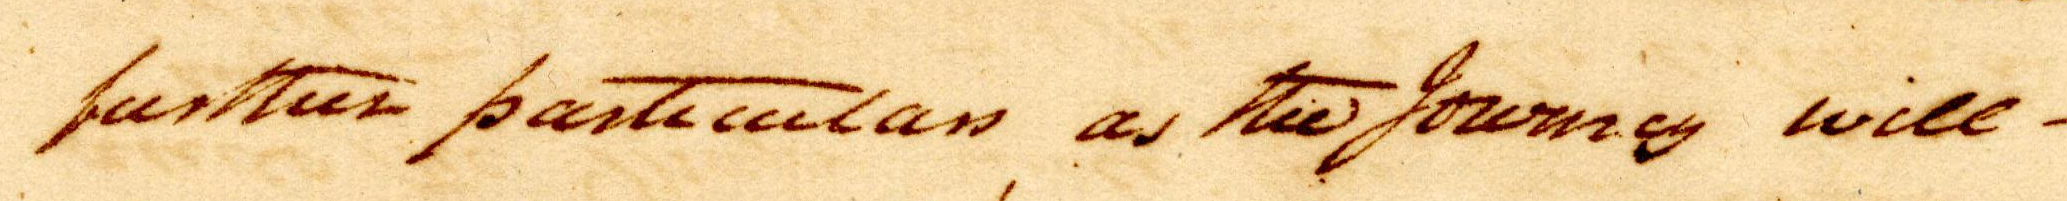further particulars as thee Journey will
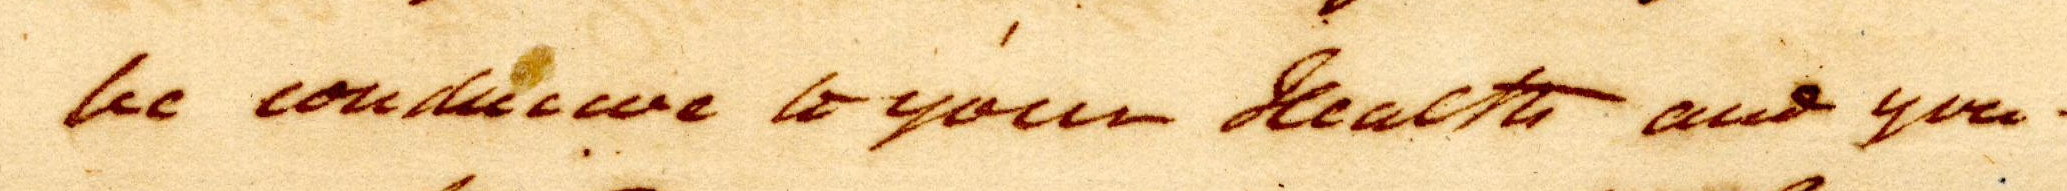be conducive to your Health and you
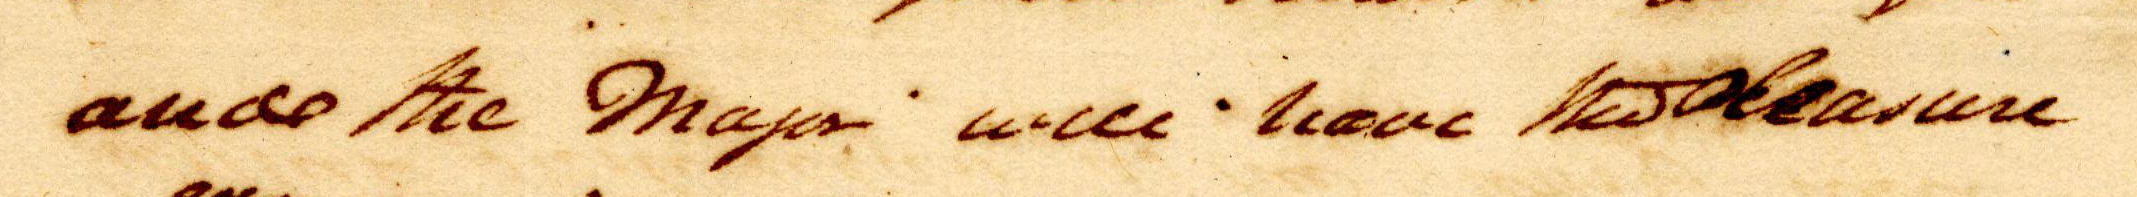and the Major will have the Pleasure
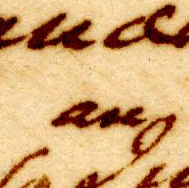an
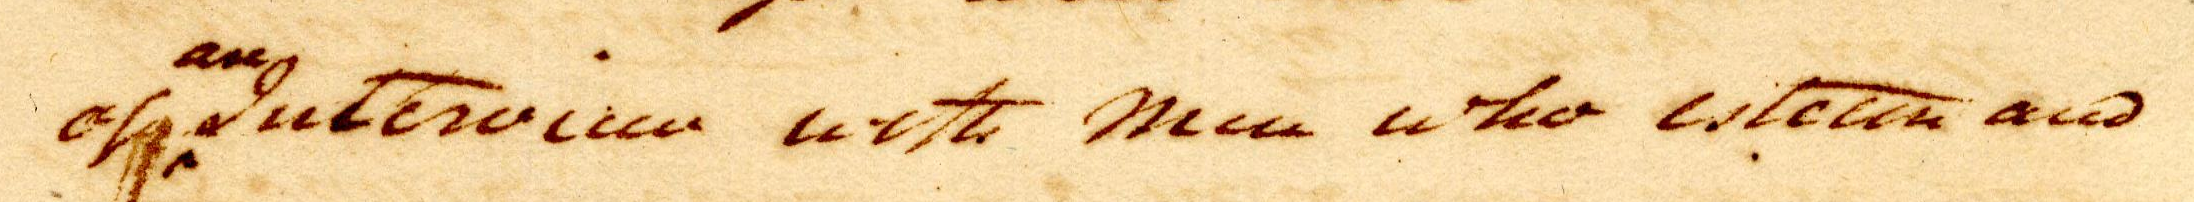of ^ Interview with Men who Esteem and
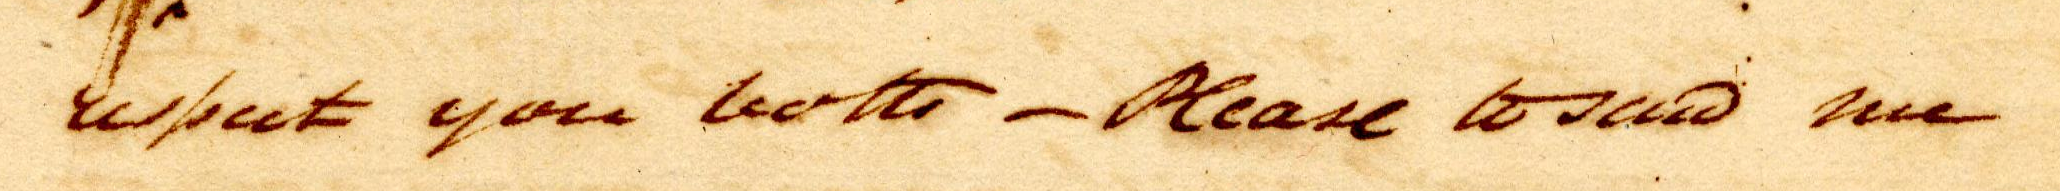respect you both- Please to send me
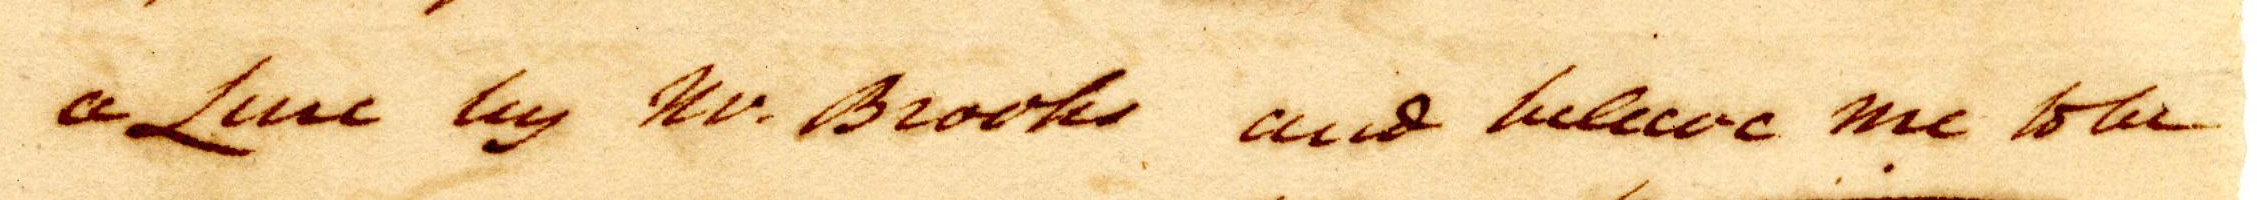a Line by W. Brooks and believe me to be
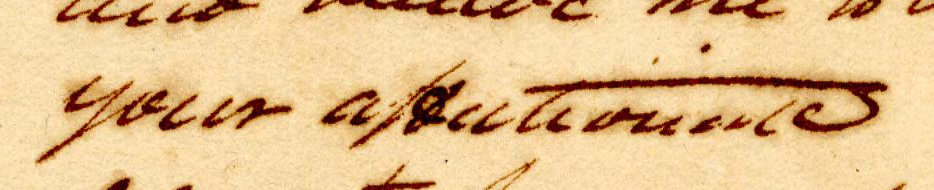your affectionate
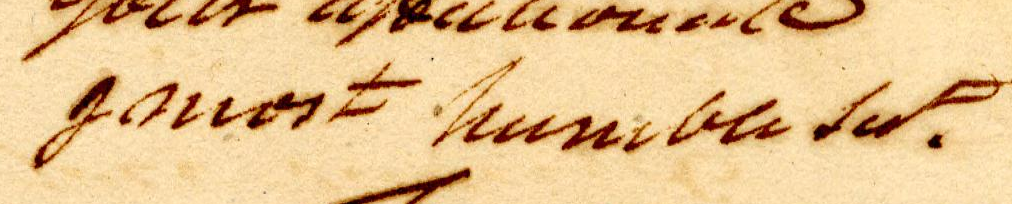& most humble Serv^t.
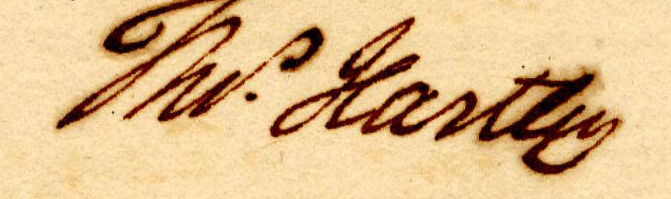Tho^s Hartley
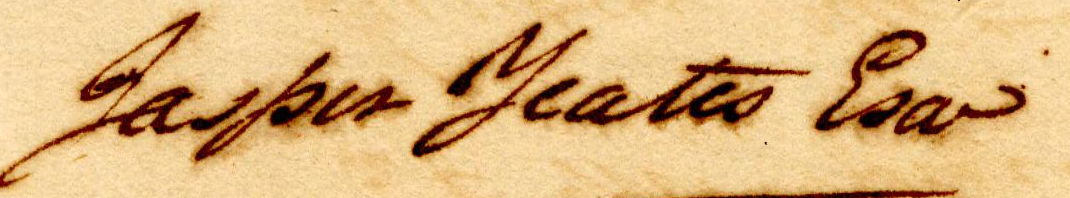Jasper Yeates Esq
